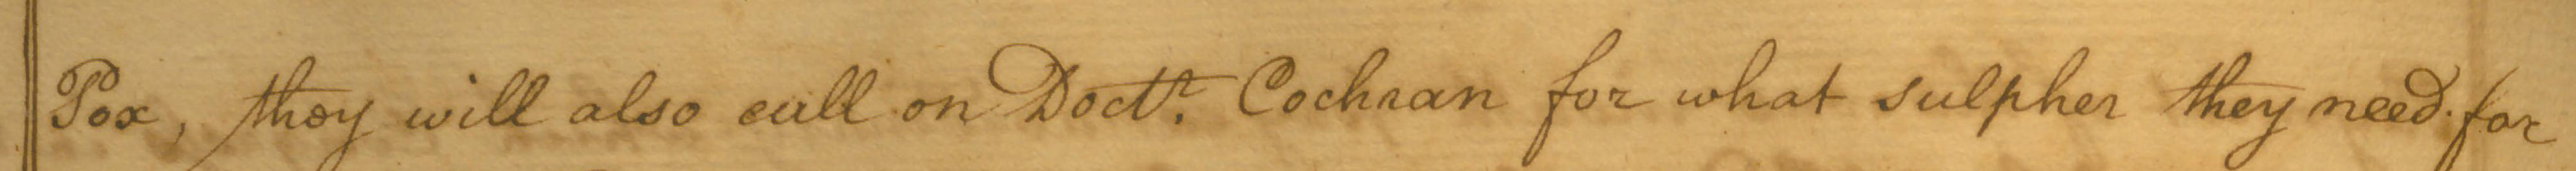Pox, they will also call on Doct^r. Cochran for what sulpher they need for
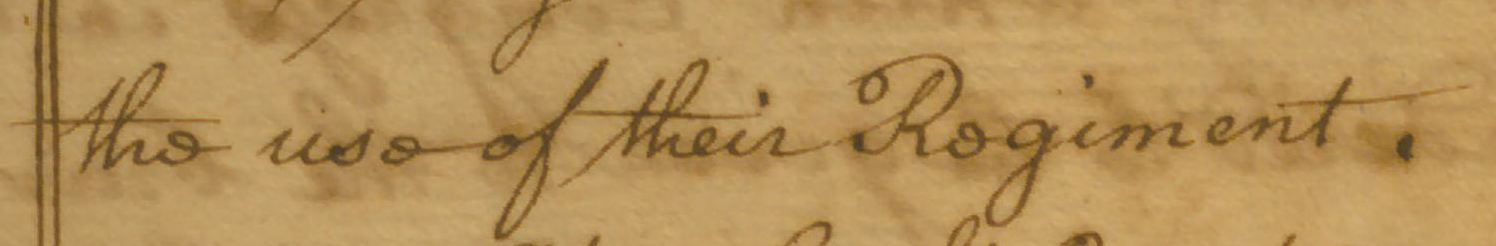the use of their Regiment.
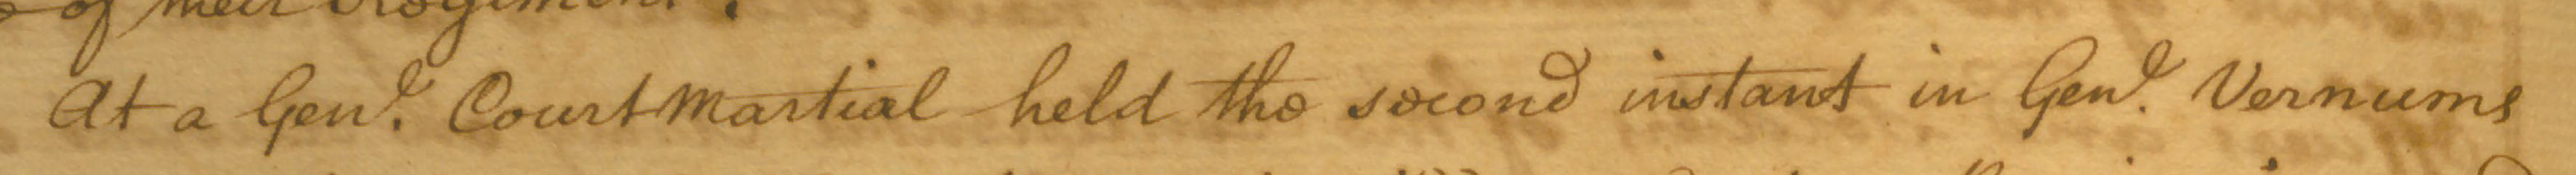At a Gen^l. Court Martial held the second instant in Gen^l. Vernums
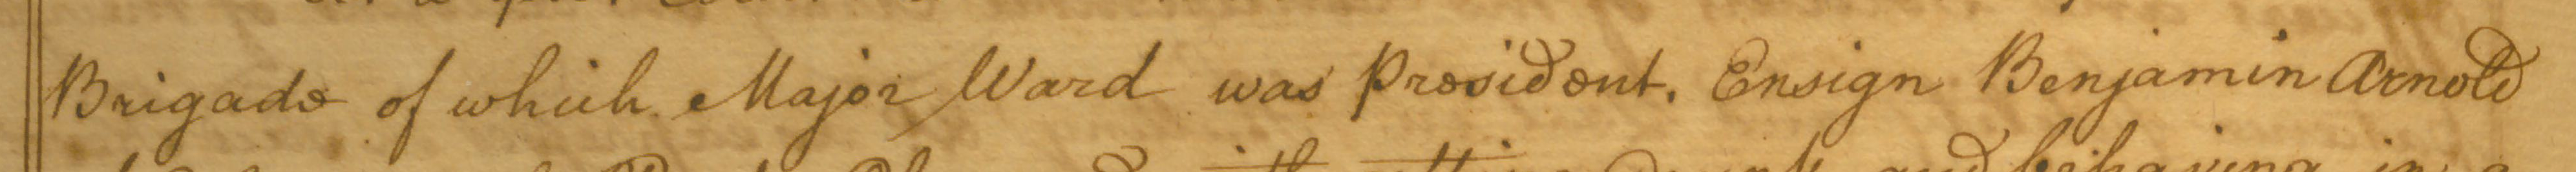Brigade of which Major Ward was president, Ensign Benjamin Arnold
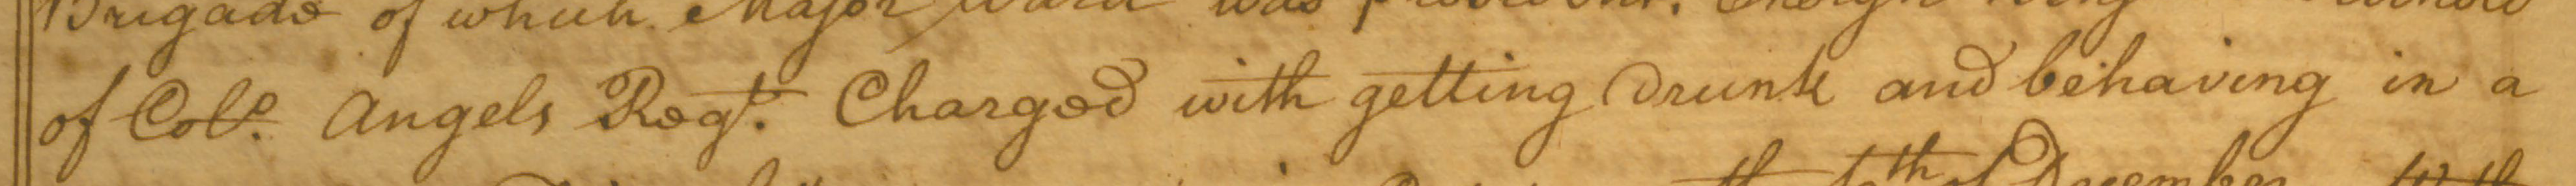of Col^o. Angels Reg^t. Charged with getting drunk and behaving in a
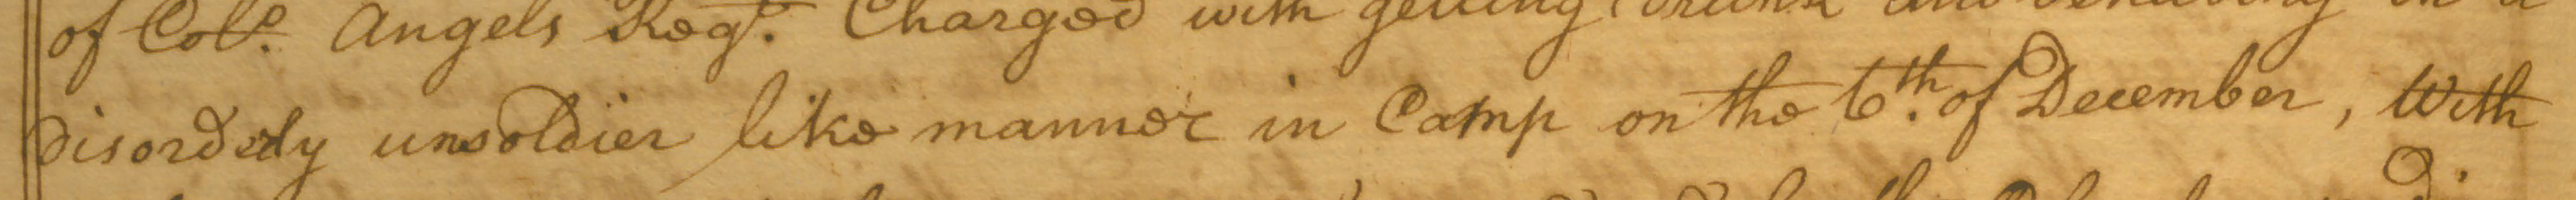disorderly unsoldier like manner in Camp on the 6^th. of December, With
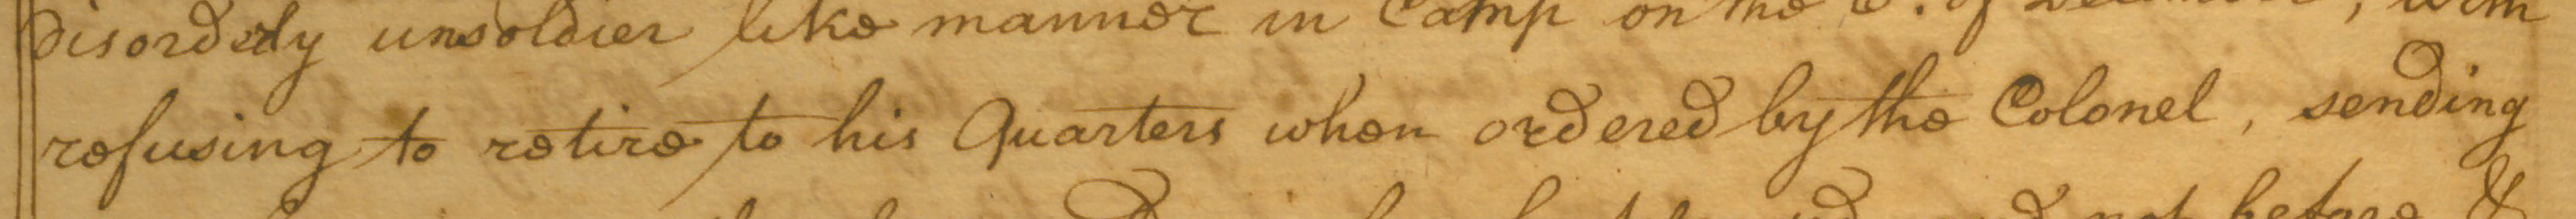refusing to retire to his Quarters when ordered by the Colonel, sending
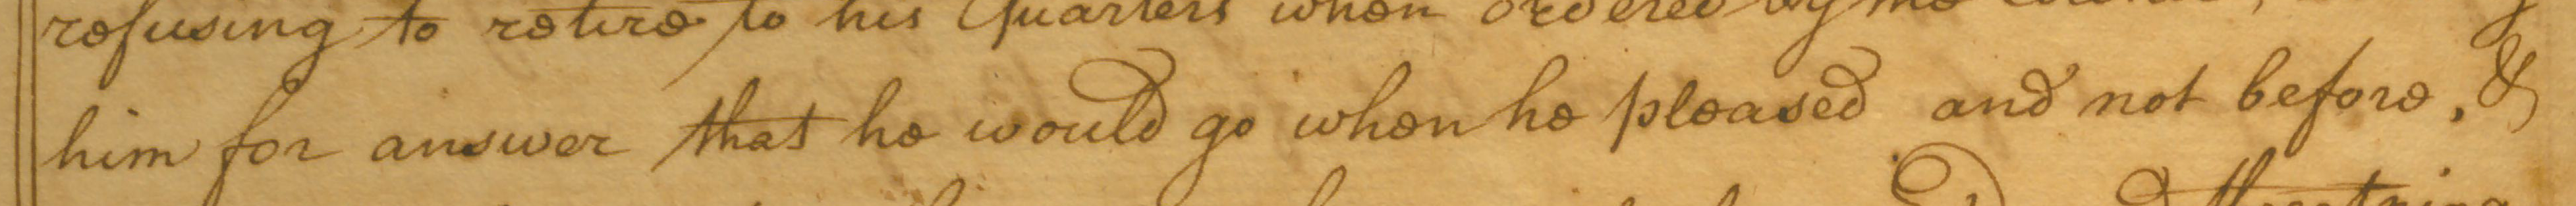him for answer that he would go when he pleased and not before, &
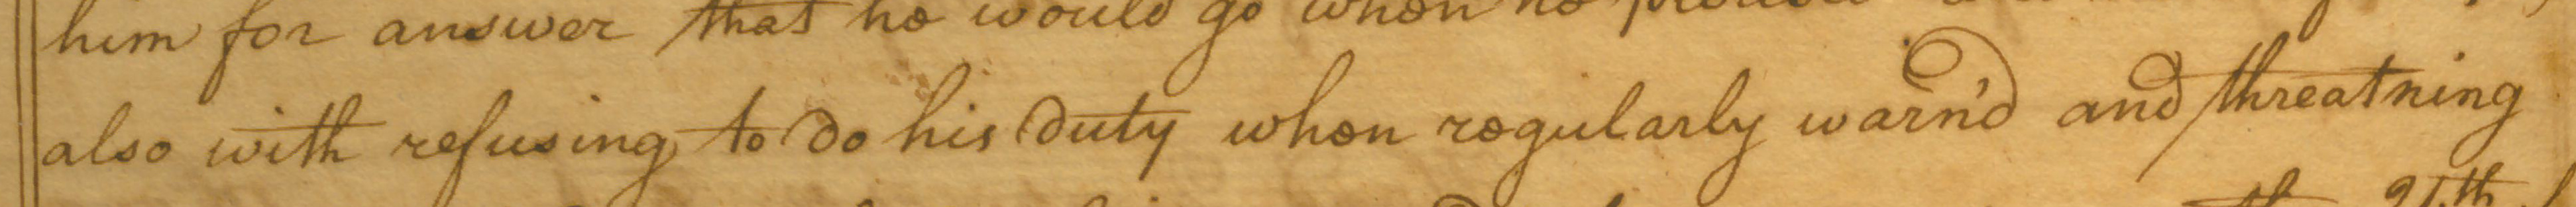also with refusing to do his duty when regularly warn'd and threatning
